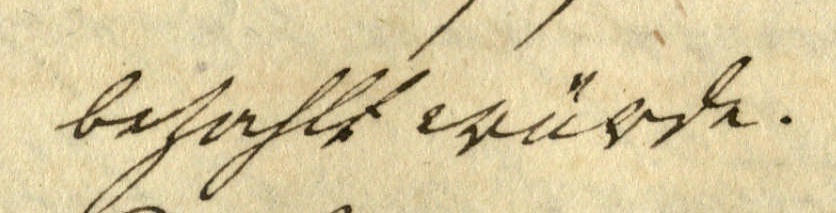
bezahlt würde.
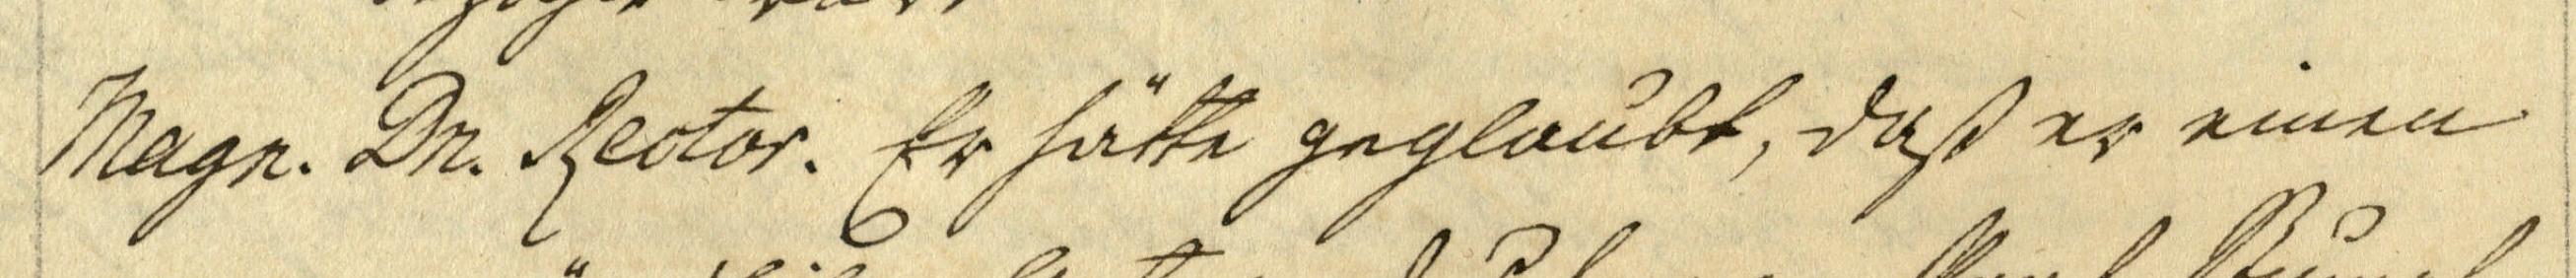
Magn. Dn. Rector. Er hätte geglaubt, daß er einen
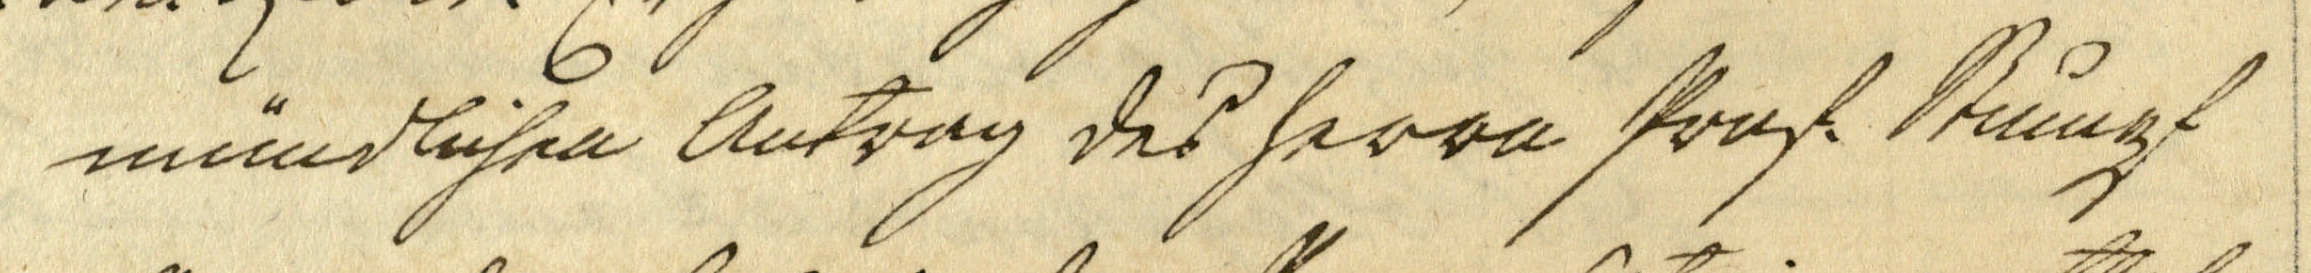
mündlichen Antrag des Herrn Prof. Stumpf
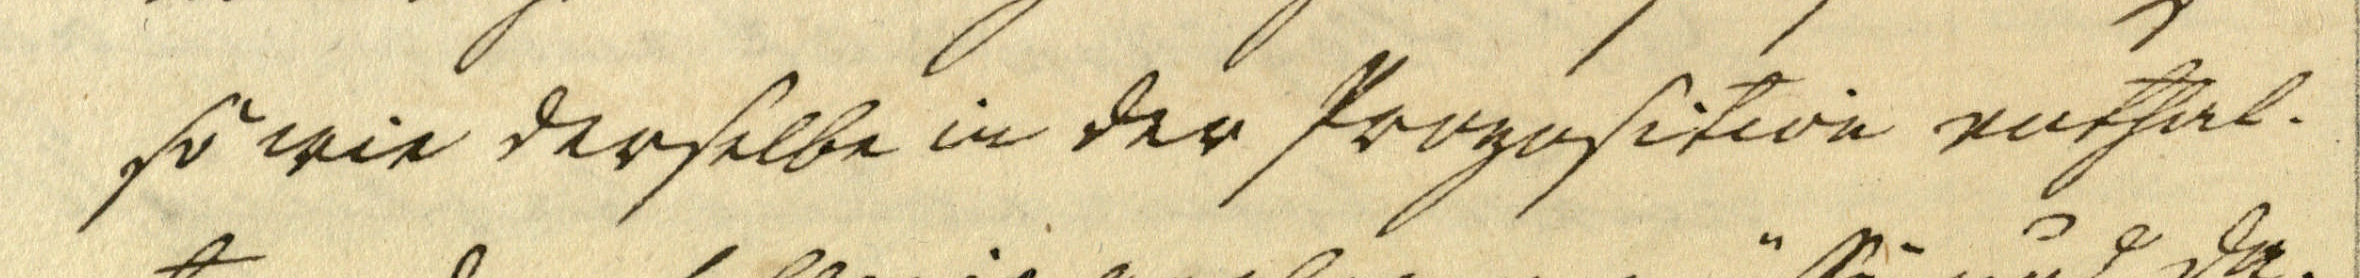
so wie derselbe in der Proposition enthal¬
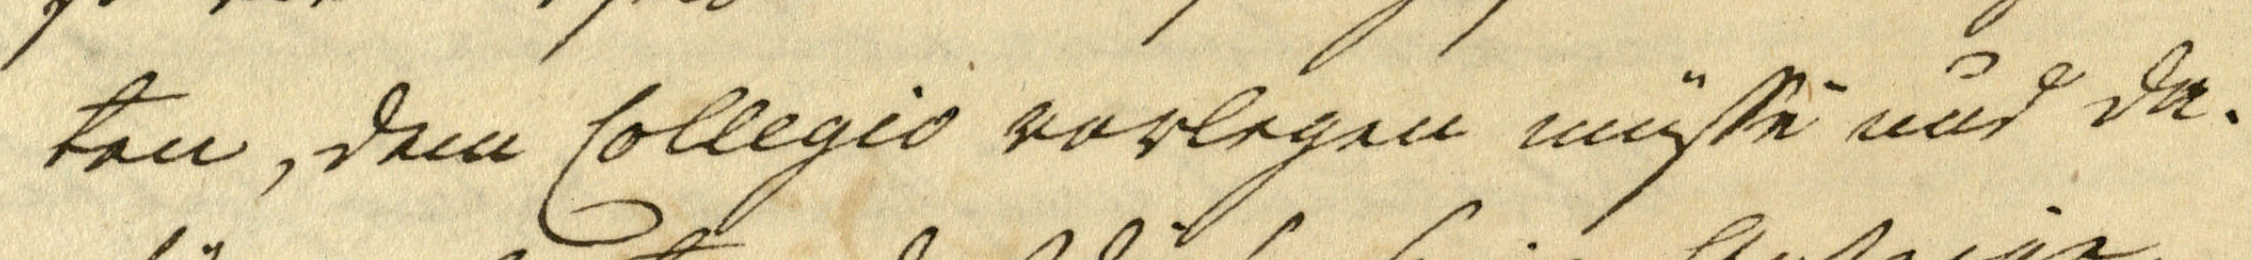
ten, dem Collegio vorlegen müsse und da¬
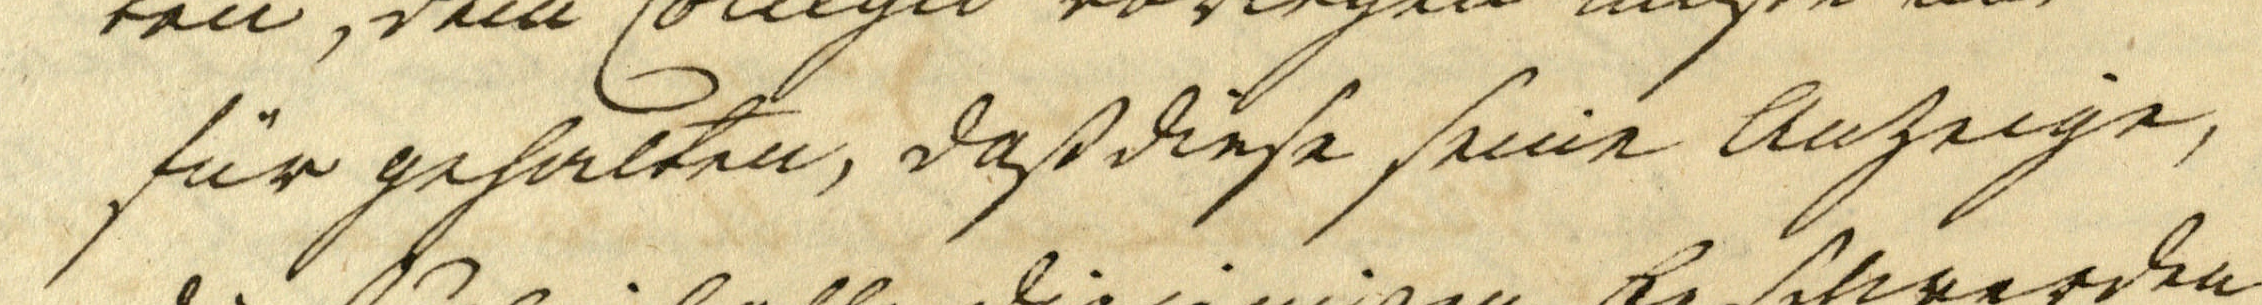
für gehalten, daß diese seine Anzeige,
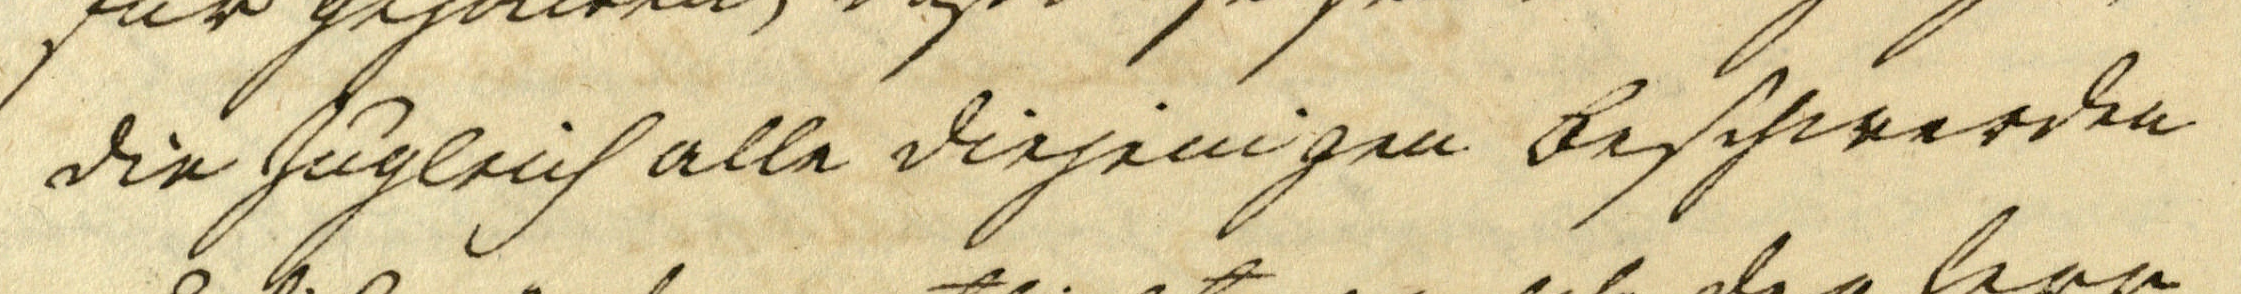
die zugleich alle diejenigen Beschwerden
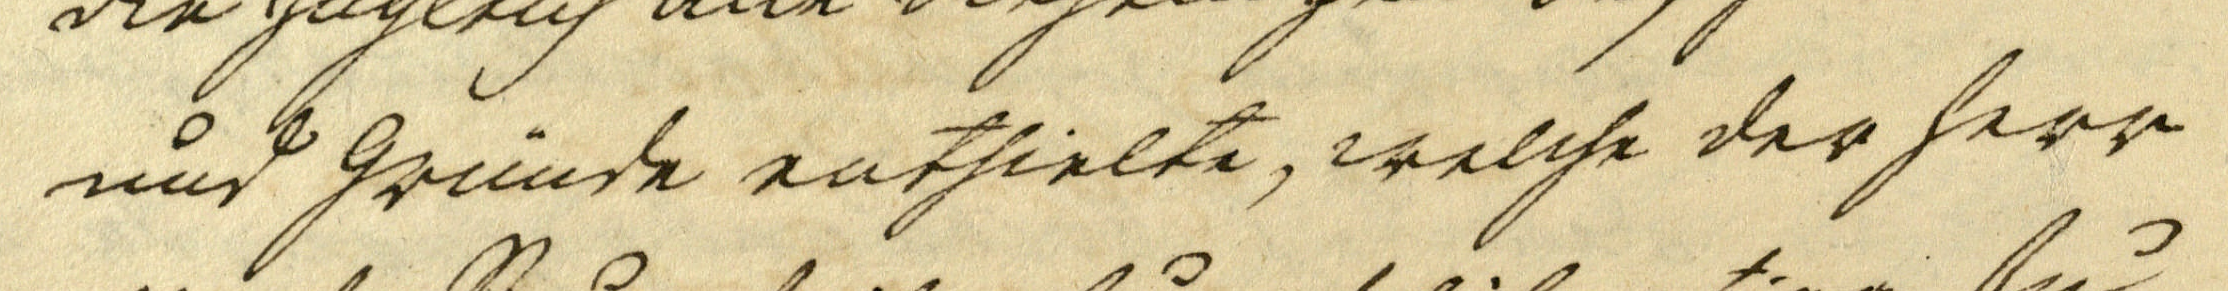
und Gründe enthielte, welche der Herr
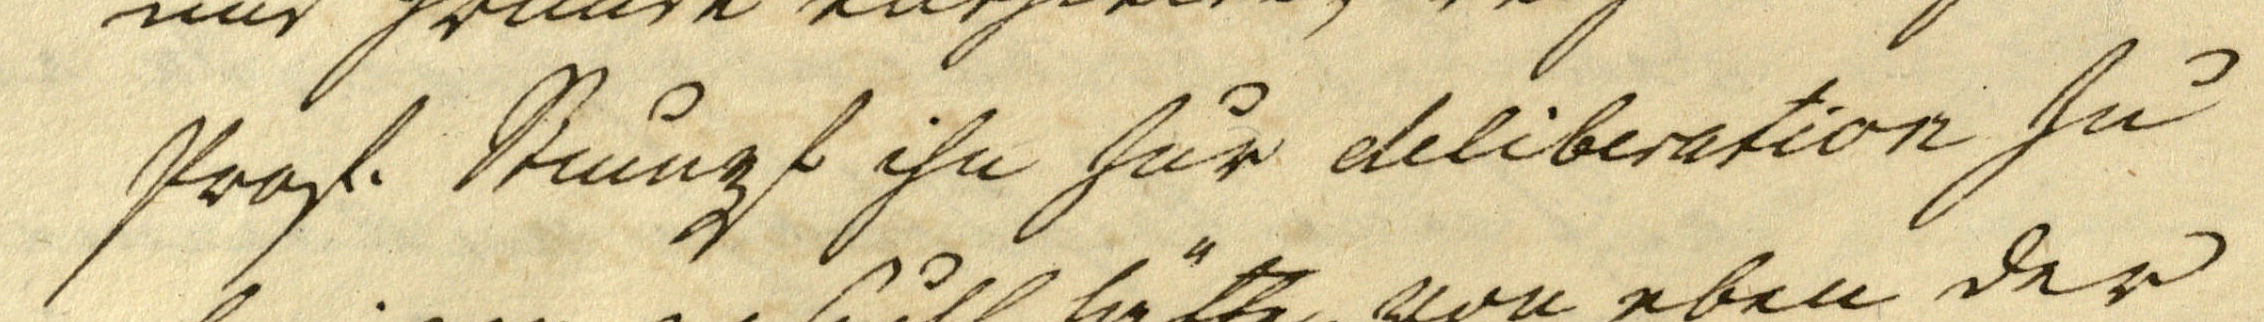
Prof. Stumpf ihn zur Deliberation zu
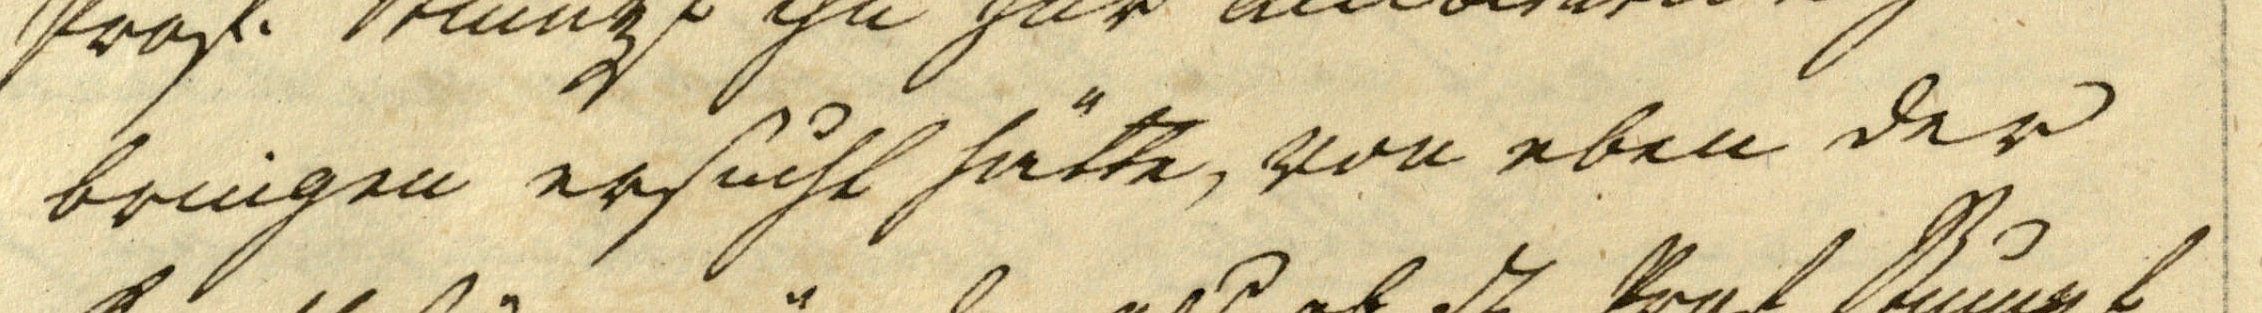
bringen ersucht hätte, von eben der
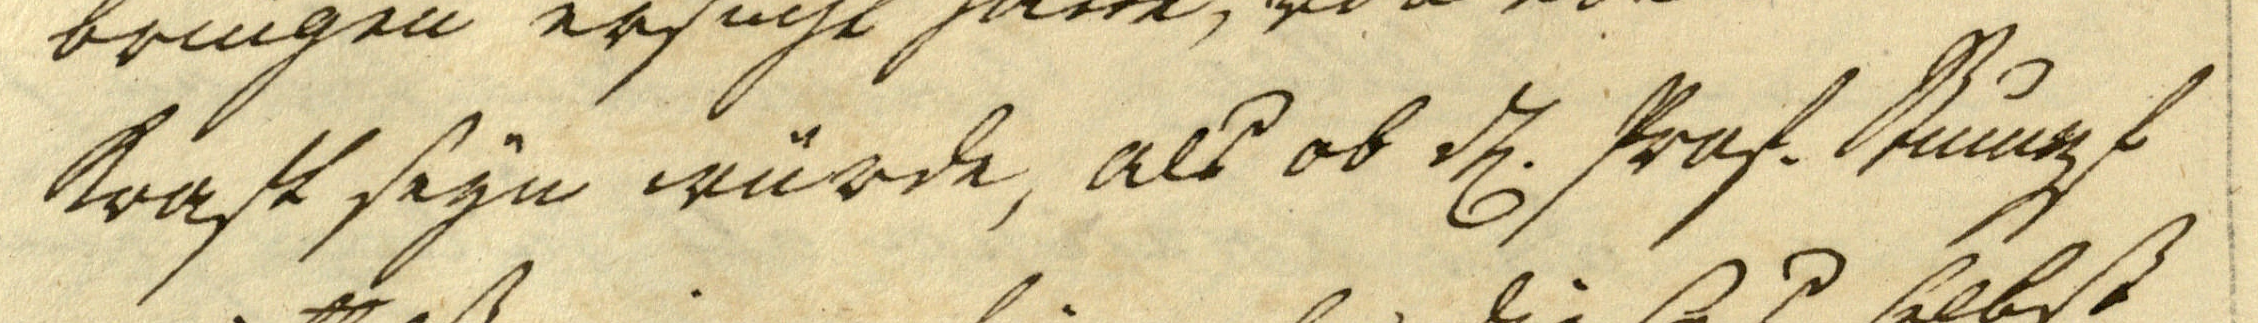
Kraft seÿn würde, als b dh. Prof. Stumpf
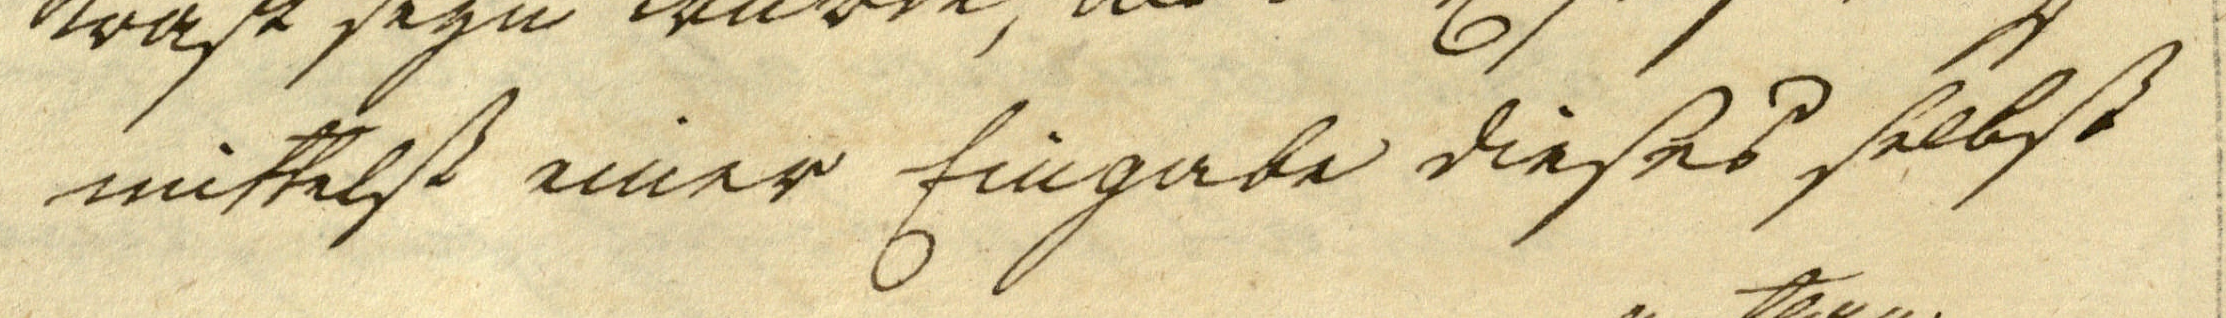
mittelst einer Eingabe dieses selbst
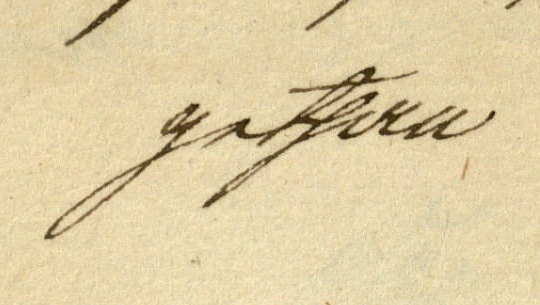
gethan
